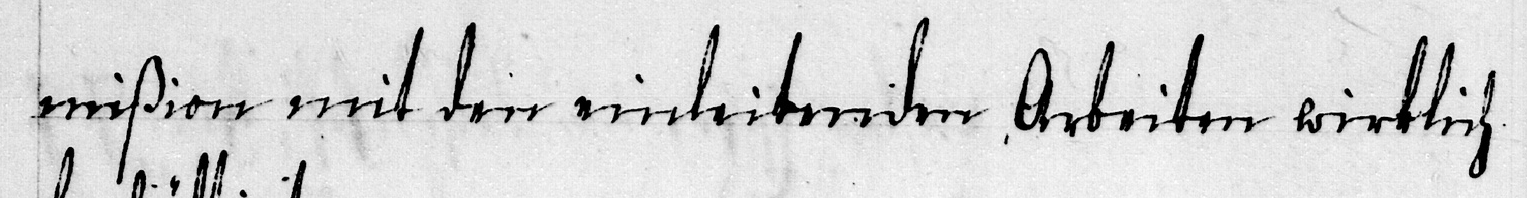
mißion mit den einleitenden Arbeiten wirklich
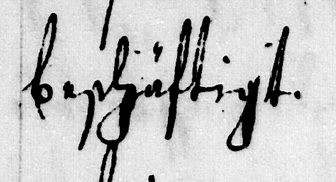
schäftigt.
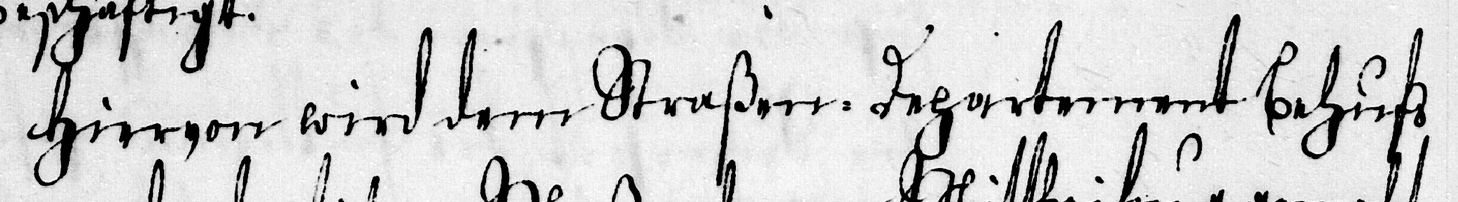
Hiervon wird dem Straßen-Departement Behufs
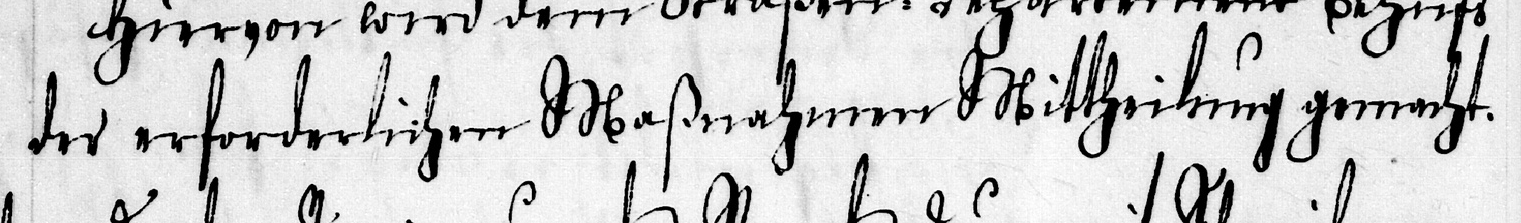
der erforderlichen Maßnahmen Mittheilung gemacht.
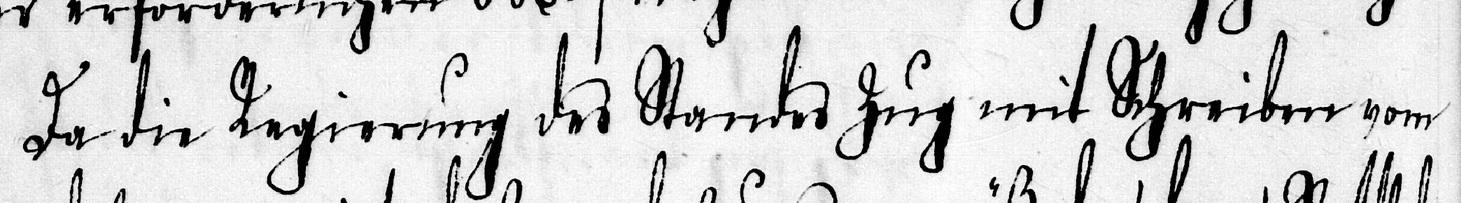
Da die Regierung des Standes Zug mit Schreiben vom
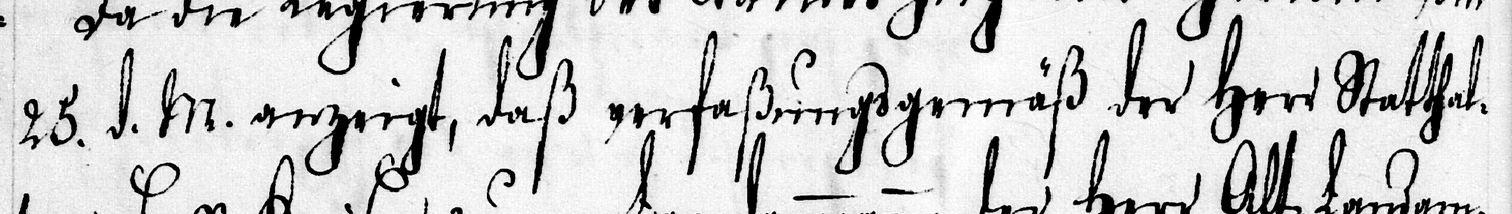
25. d. M. anzeigt, daß verfaßungsgemäß der Herr Stattha¬
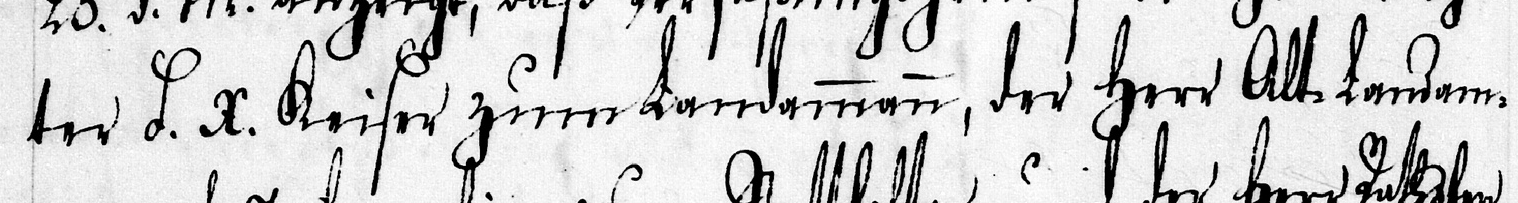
lter F. X. Keiser zum Landammann, der Herr Alt-Landam¬
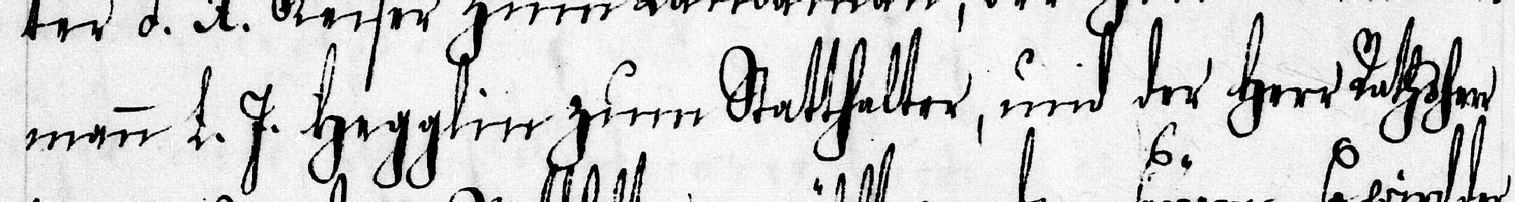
mann L. J. Hegglin zum Statthalter, und der Herr Rathsh¬
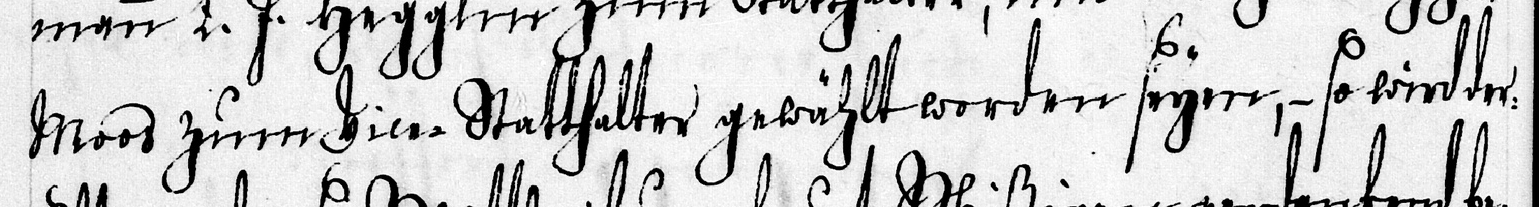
Moos zum Vice-Statthalter gewählt worden seyen, – so wird der¬
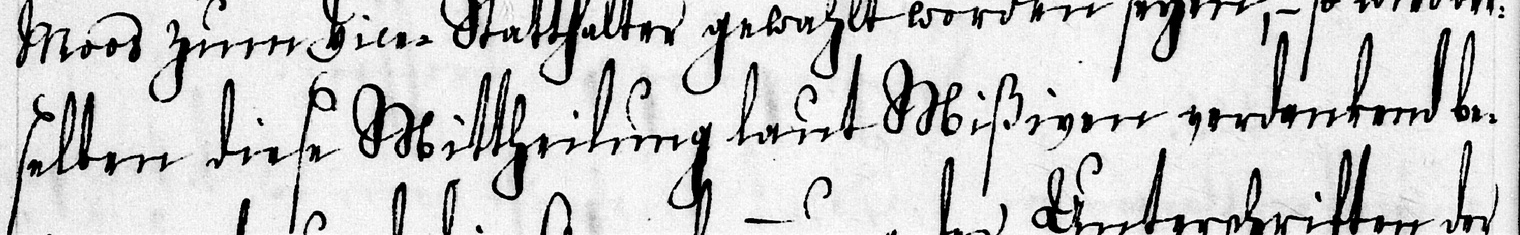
selben diese Mittheilung laut Mißiven verdankend b¬
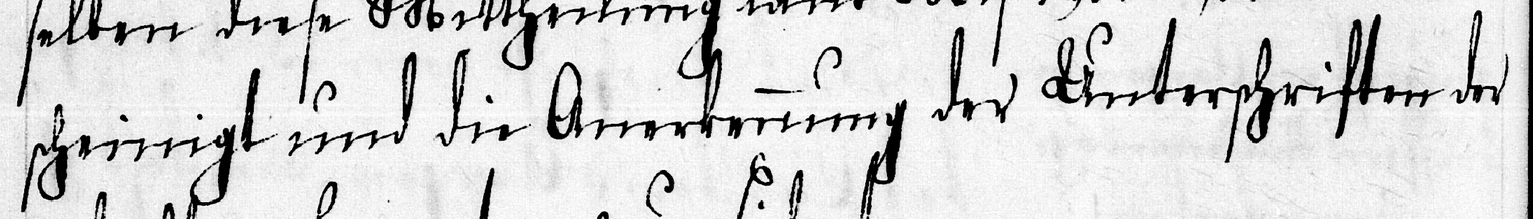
scheinigt und die Anerkennung der Unterschriften der
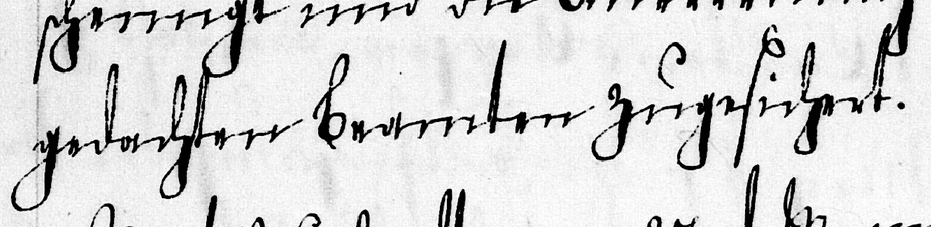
gedachten Beamten zugesichert.
